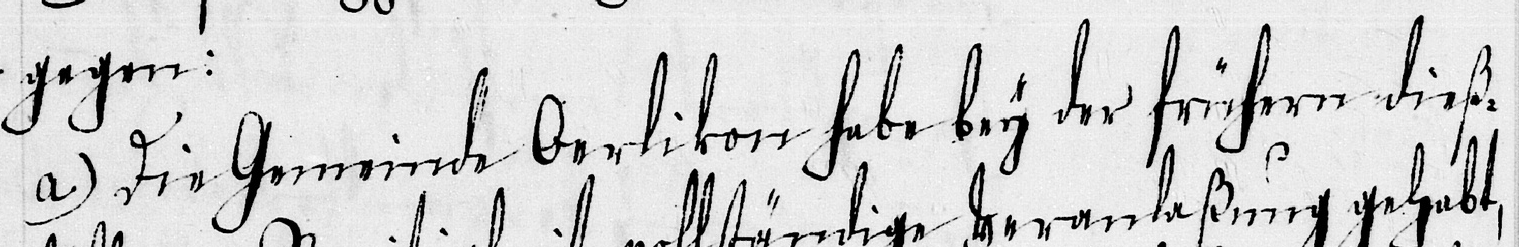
a.) Die Gemeinde Oerlikon habe bey der frühern dieß¬
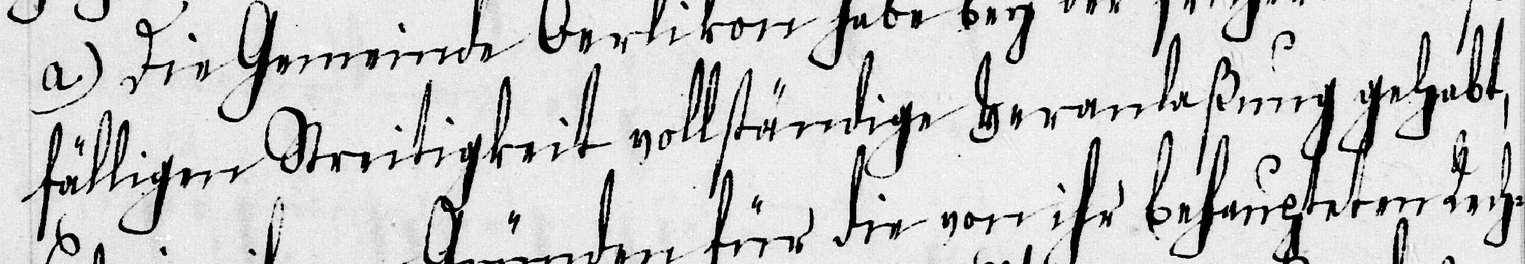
fälligen Streitigkeit vollständige Veranlaßung gehabt,
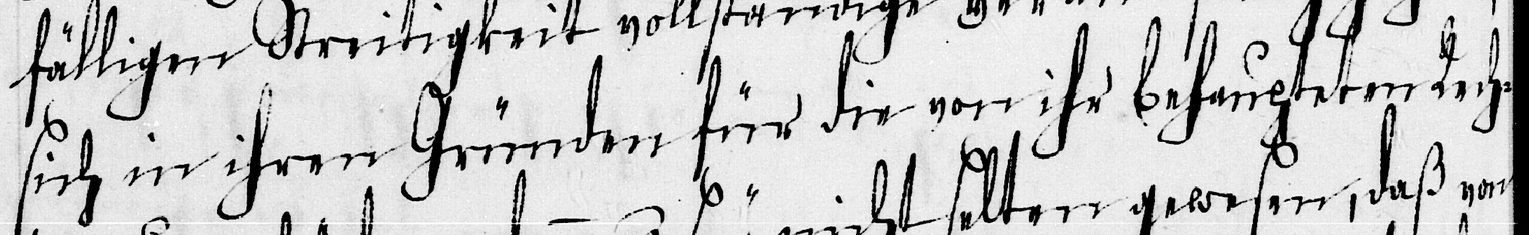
sich in ihren Gründen für die von ihr behaupteten Rec¬
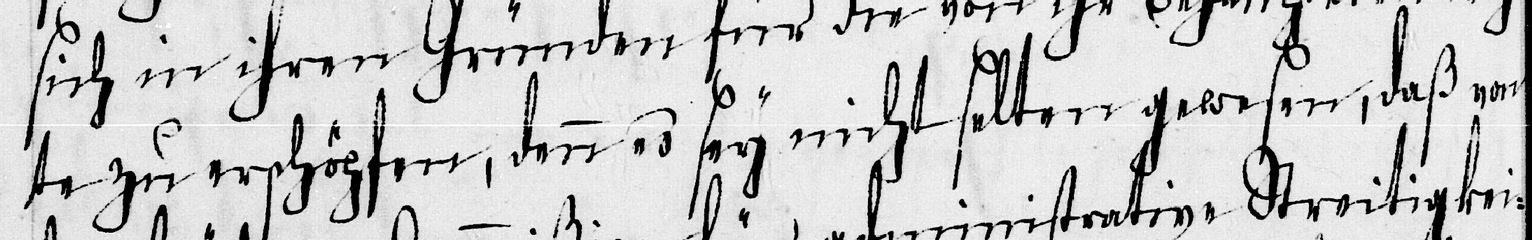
hte zu erschöpfen, denn es sey nicht selten gewesen, daß von
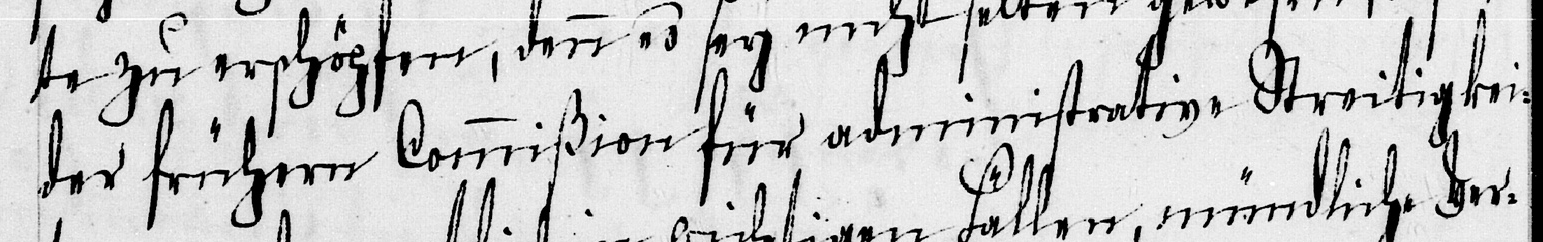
der frühern Commißion für administrative Streitigkei¬
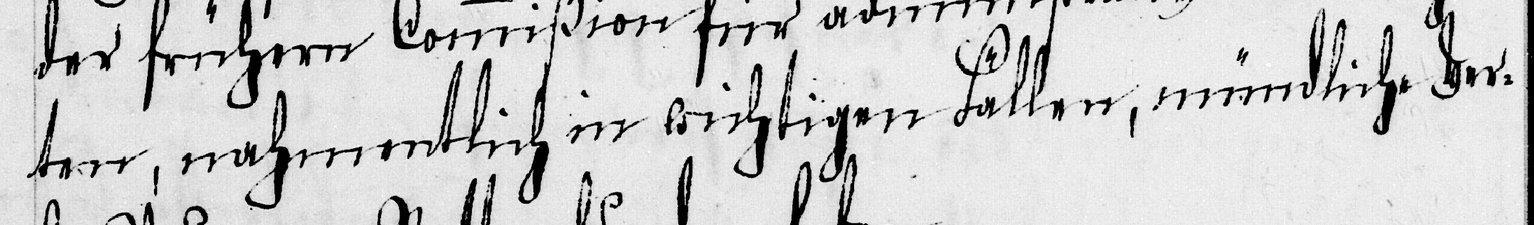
ten, nahmentlich in wichtigen Fällen, mündliche Ver¬
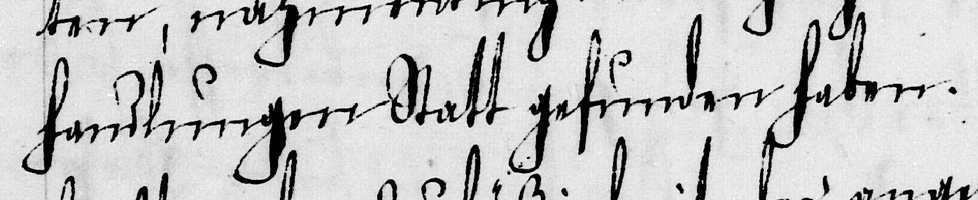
handlungen Statt gefunden haben.
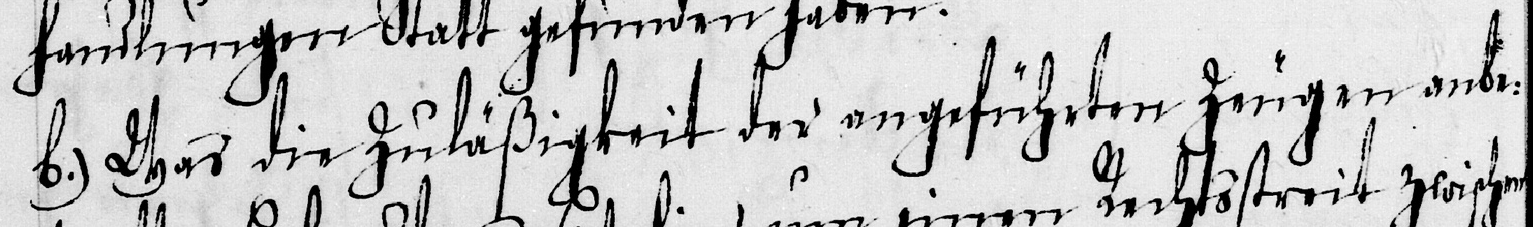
b.) Was die Zuläßigkeit der angeführten Zeugen anbe¬
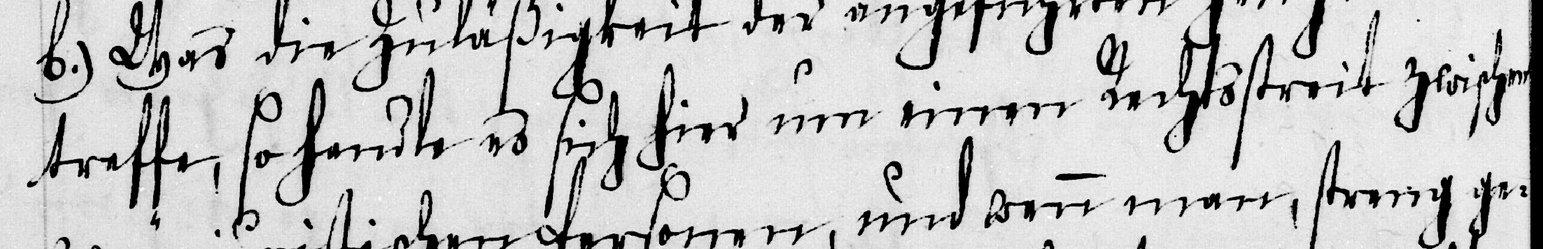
treffe, so handle es sich hier um einen Rechtsstreit zwisch¬
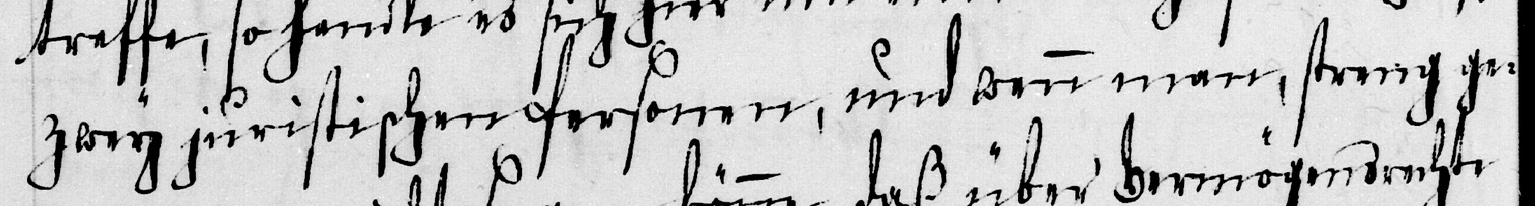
zwey juristischen Personen, und wenn man, streng ge¬
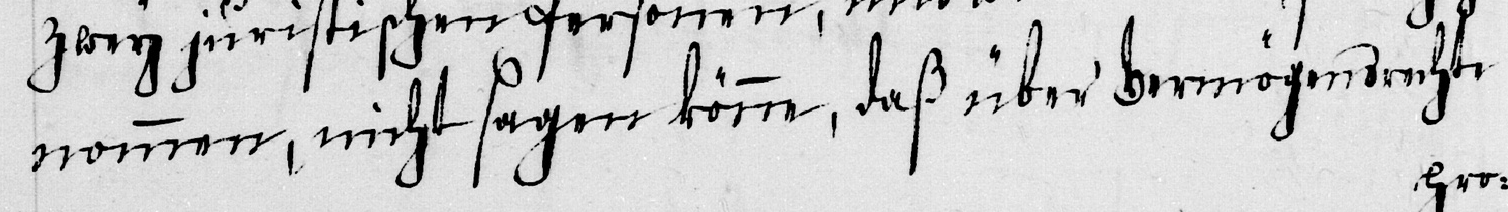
nommen, nicht sagen könne, daß über Vermögensrechte
